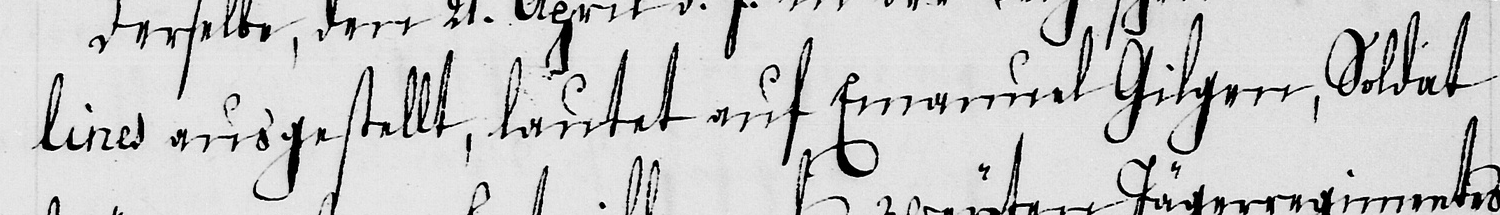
lines ausgestellt, lautet auf Emanuel Gilgen, Soldat
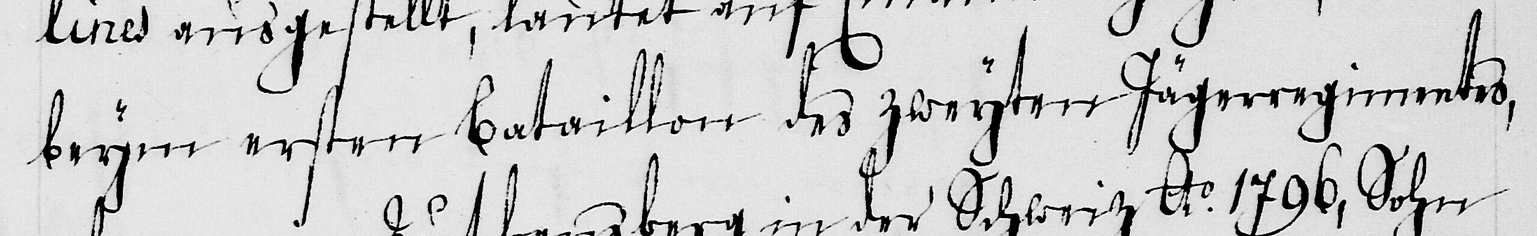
beym ersten Batallion des zweyten Jägerregimentes,
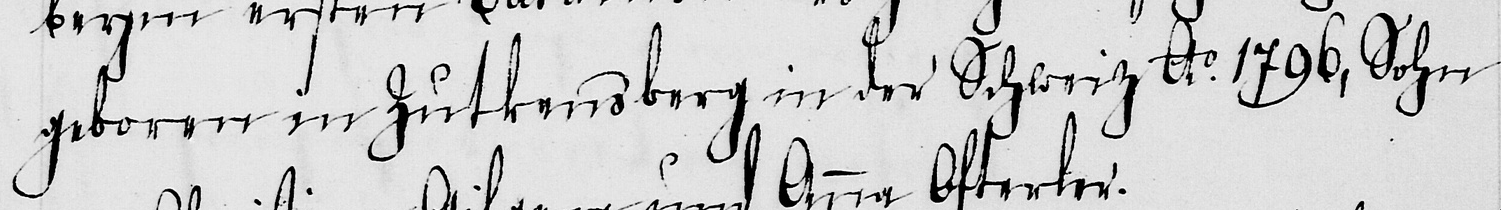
geboren in Zutkensberg in der Schweiz Ao. 1796, Sohn
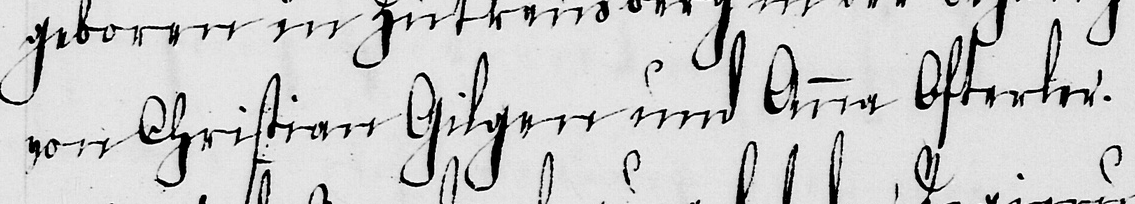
von Christian Gilgen und Anna Ofterler.
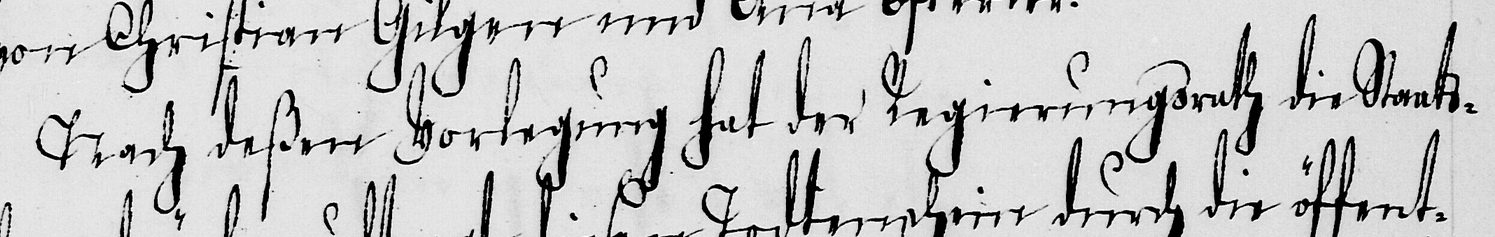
Nach deßen Vorlegung hat der Regierungsrath die Staat¬
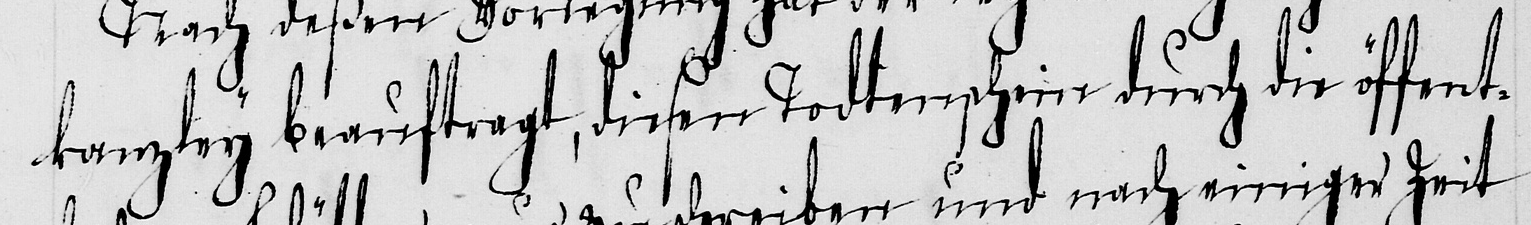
skanzley beauftragt, diesen Todtenschein durch die öffen¬
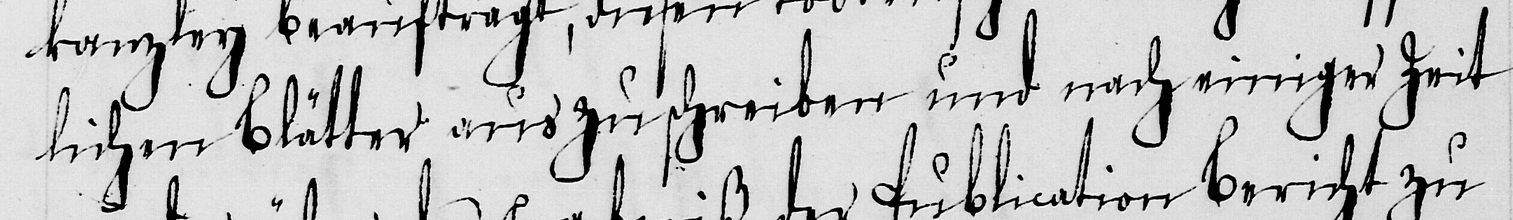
tlichen Blätter auszuschreiben und nach einiger Zeit
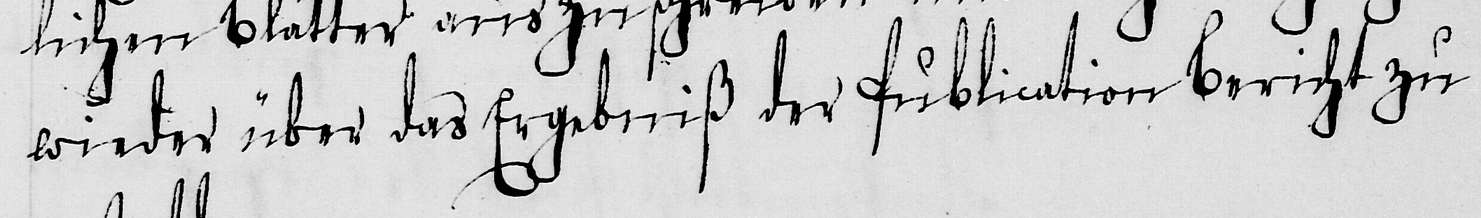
wieder über das Ergebniß der Publication Bericht zu
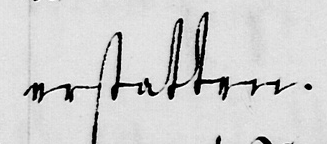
erstatten.
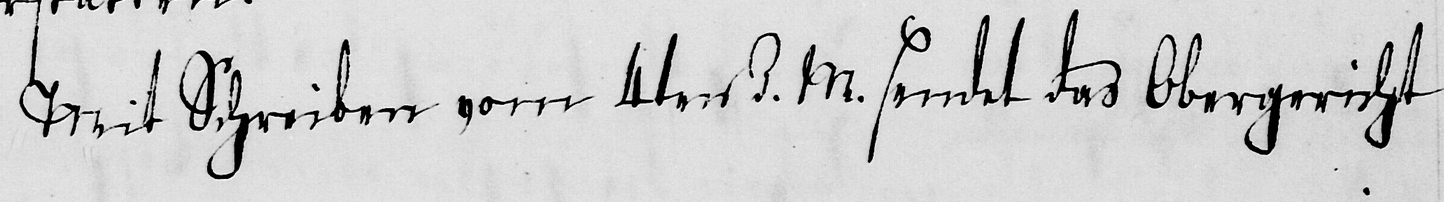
Mit Schreiben vom 4ten d. M. sendet das Obergericht
